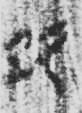好
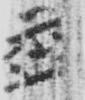亞（惡）
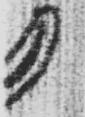勿（物）
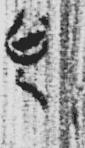也
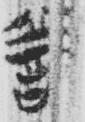善
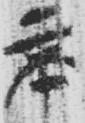不
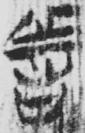善
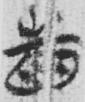眚（性）
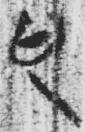也
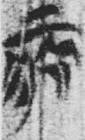所
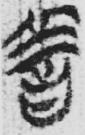善
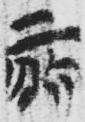所
